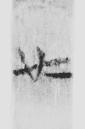{廿一}
